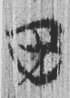困
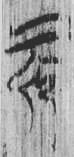而
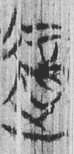○（復）
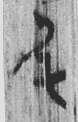氏（是）
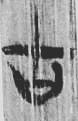古（故）
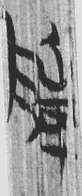陳
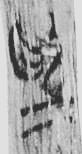爲
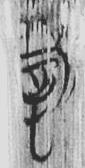新
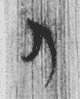人
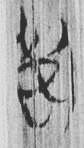死
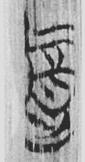○（復）
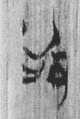爲
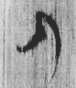人
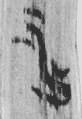水
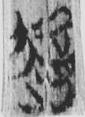○（復）
